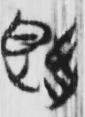既
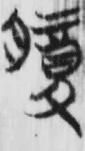腹
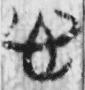心
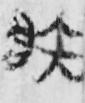疾
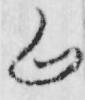㠯（以）
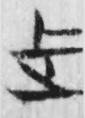上B
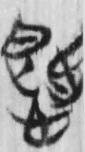○（氣）
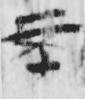不
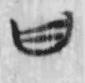甘
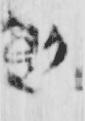○（食）
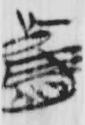舊（久）
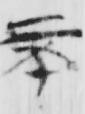不
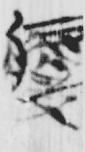○（瘥）
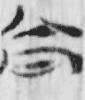尚
